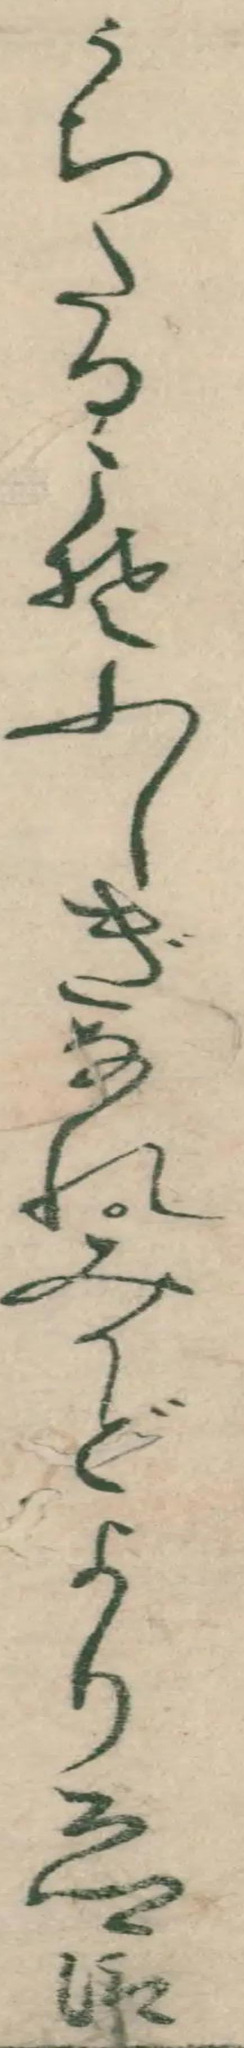うちたるこそふしぎなれ。みかどより公卿臣
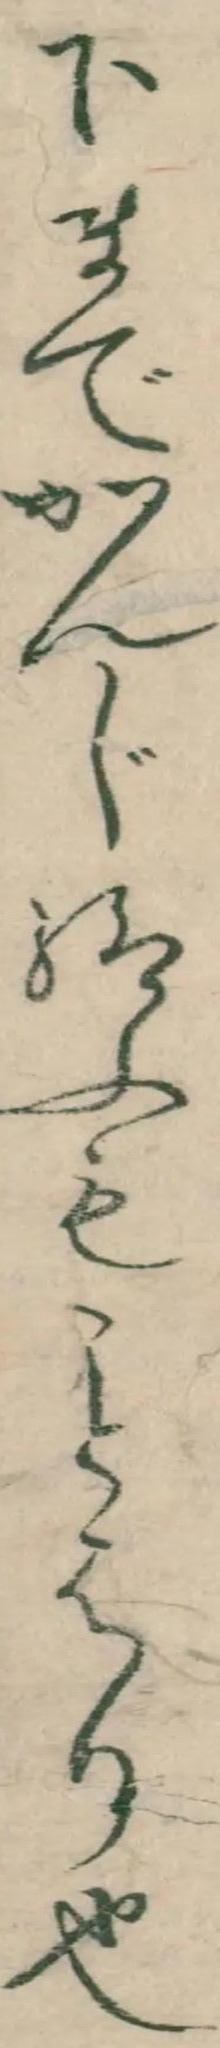下までかんじ給ふもことはり也

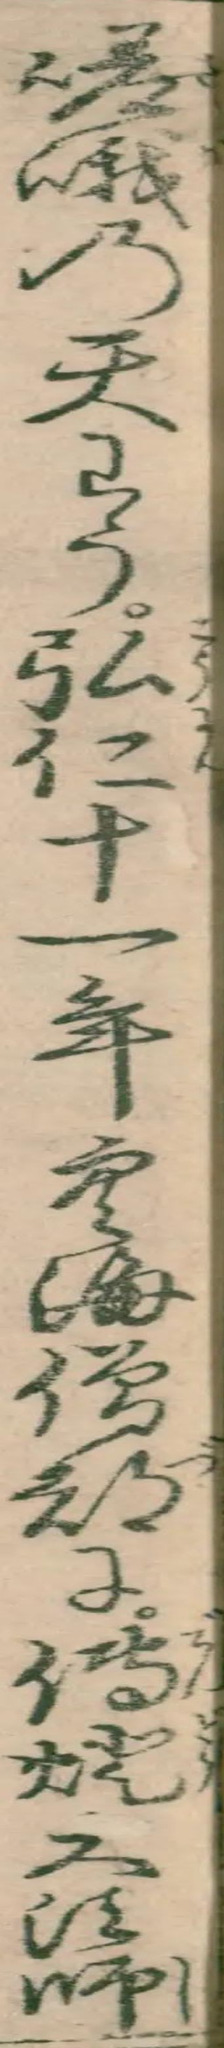嵯峨の天わう。弘仁十一年空海僧都に。伝灯大法師
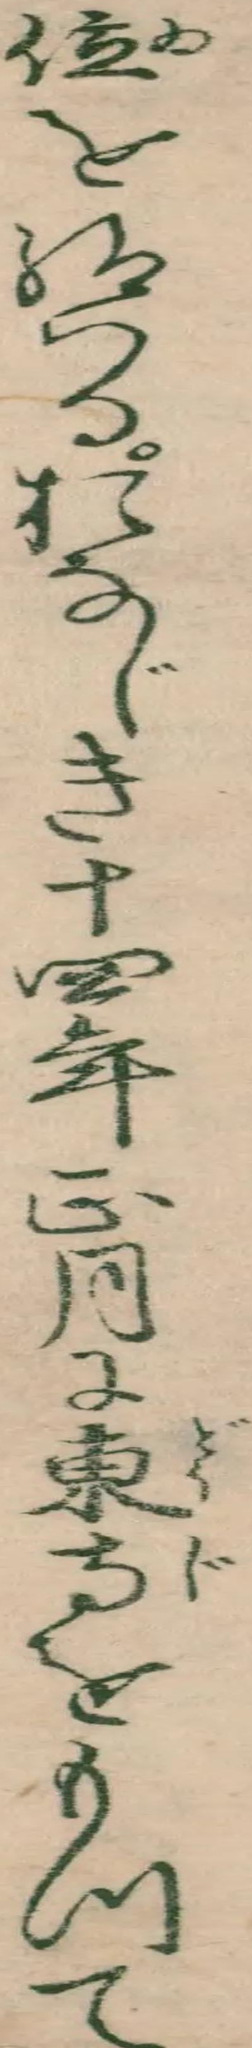位を給はる。おなじき十四年正月に東寺をもつて
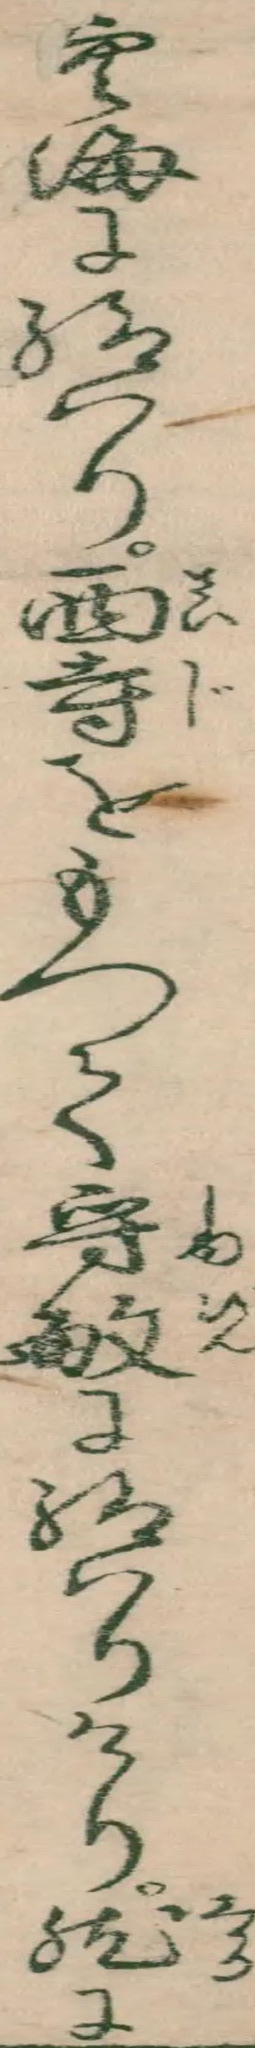空海に給はり。西寺をもつて守敏に給はりけり。然に
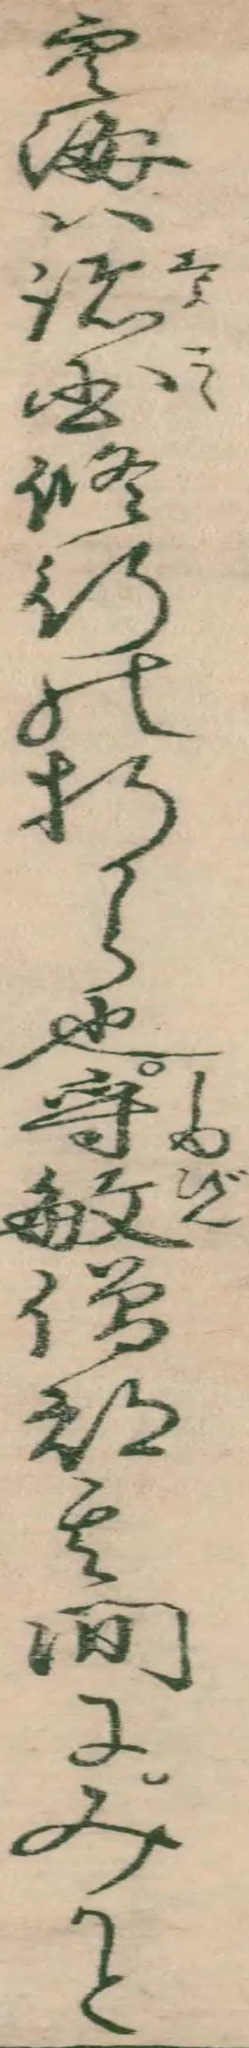空海は諸国修行の折りから也。守敏僧都其間に。みかと
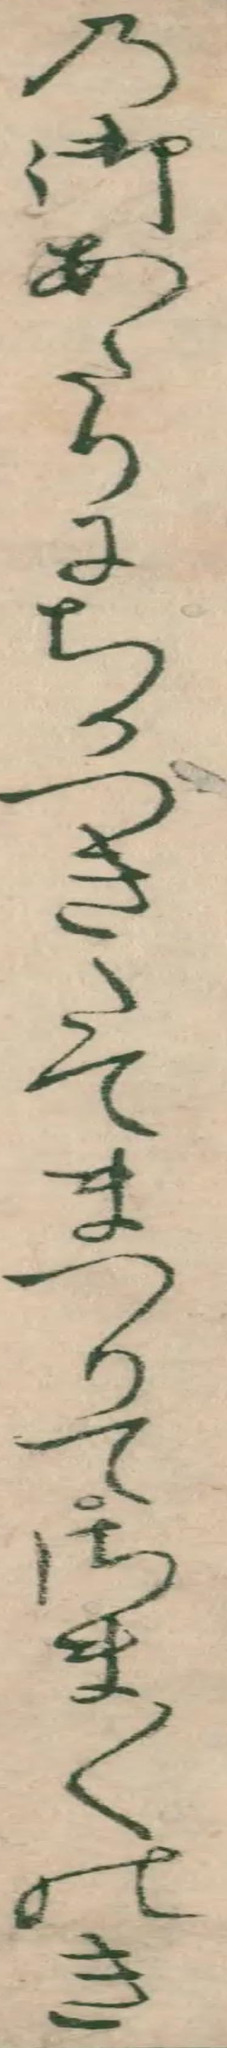の御あたりにちかつきたてまつりて。さま〳〵のき
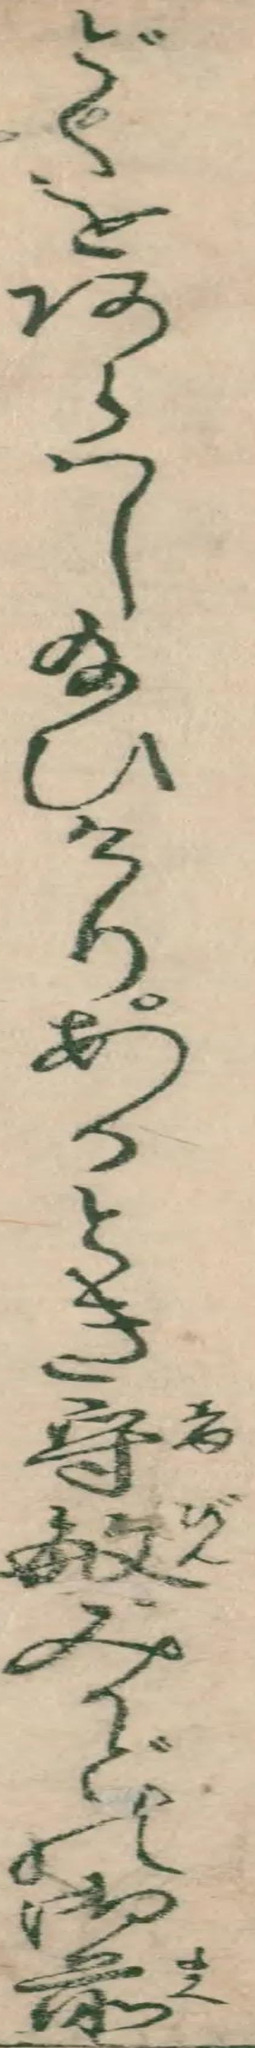どくをあらはし給ひけり。あるとき守敏みかどの御前
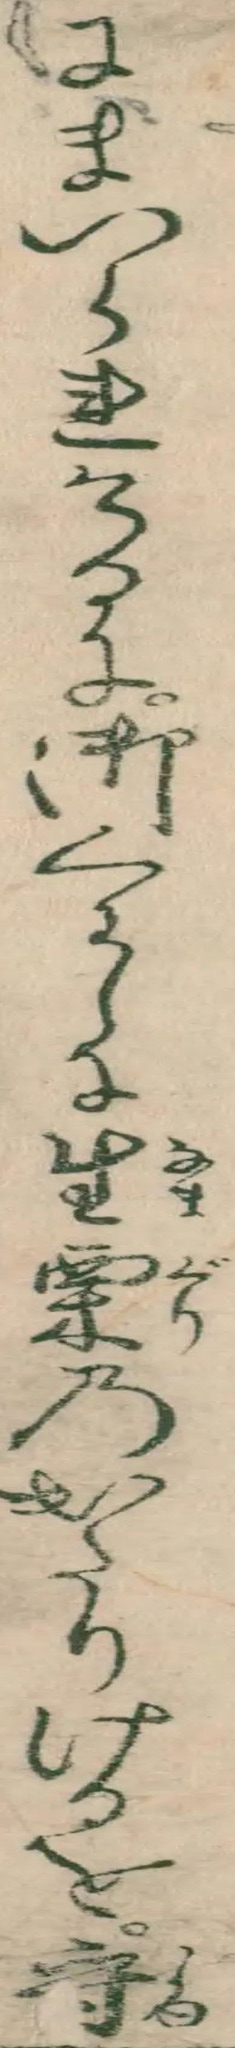にまいられけるに。御くわしに生栗の出たりけるを。守
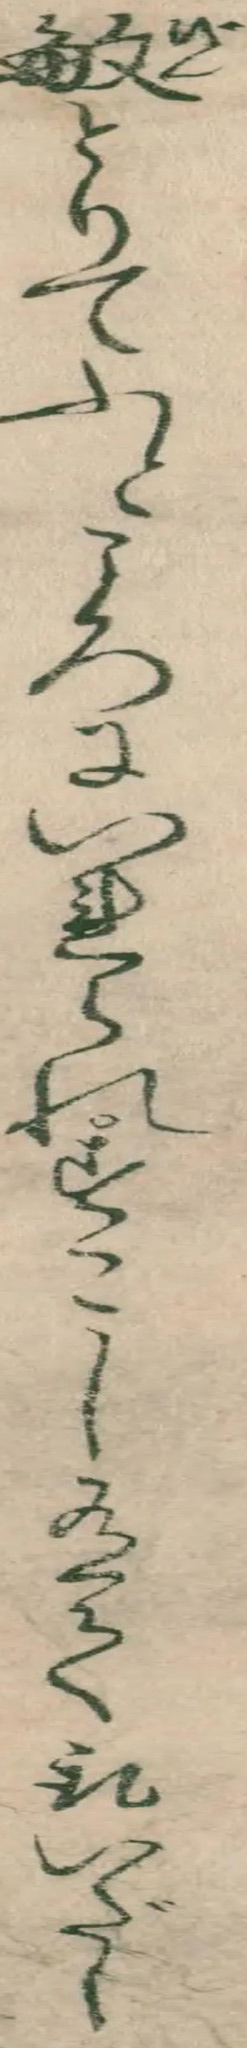敏とりてふところにいれらえ。すこし有て取いだし
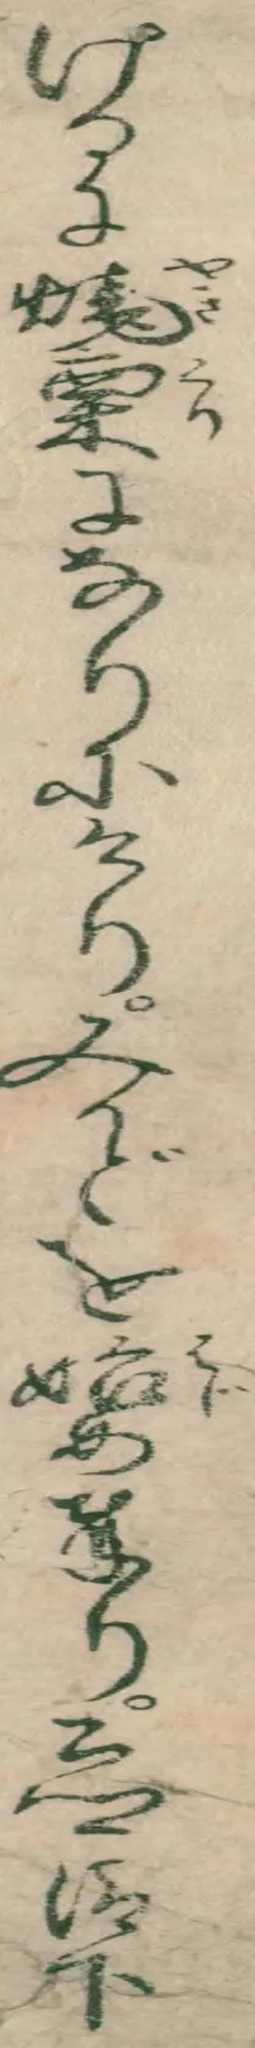けるに焼栗になりにけり。みかどを始め奉り。公卿臣下
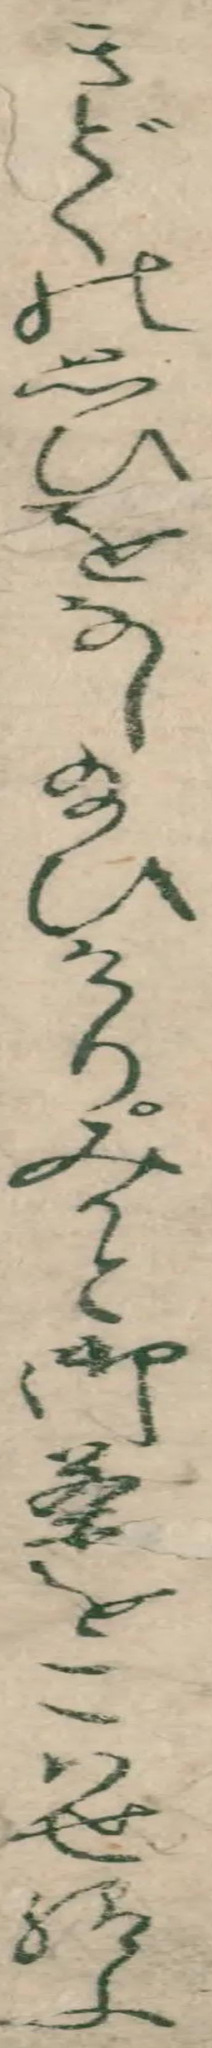きどくの思ひをなし給ひけり。みかど御茶をこはせ給ふ

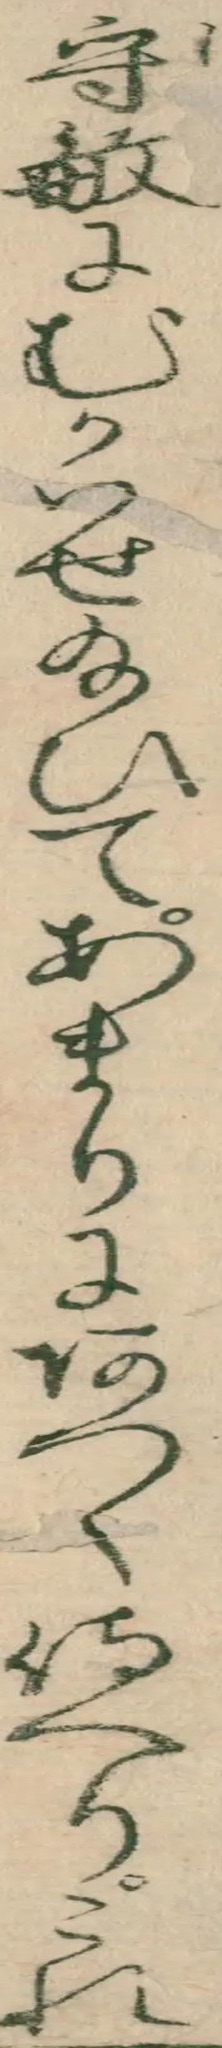守敏にむかはせ給ひて。あまりにあつく侍へり。これ
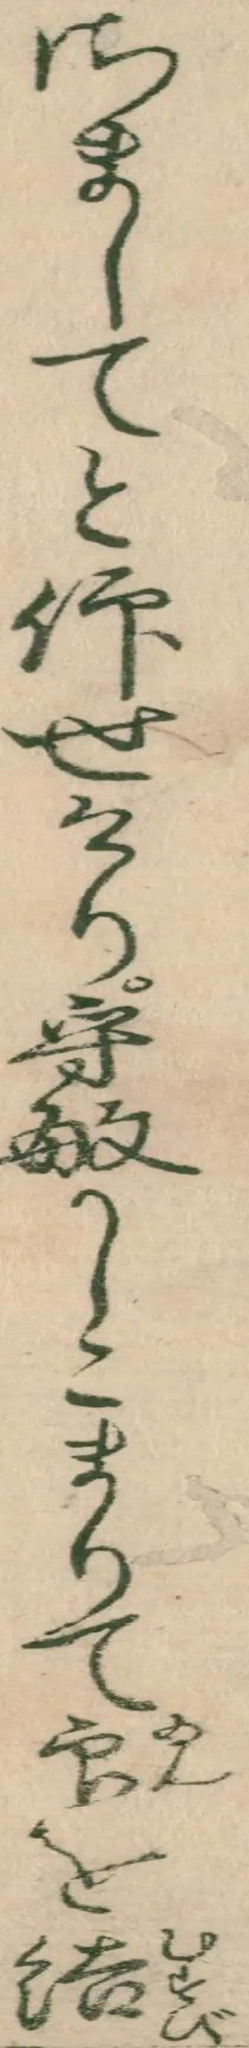さましてと仰せけり。守敏かしこまりて印を結
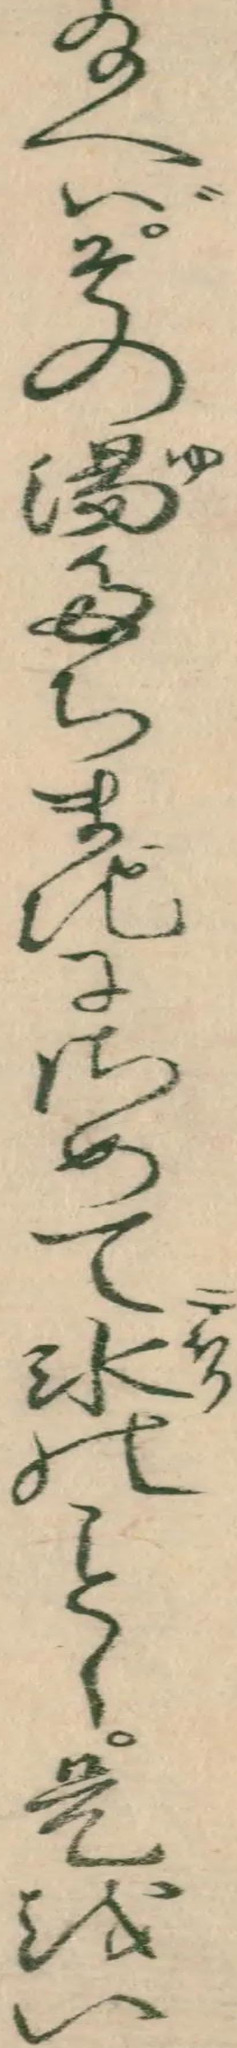給へば。その湯たちまちにさめて氷のことし。是をい
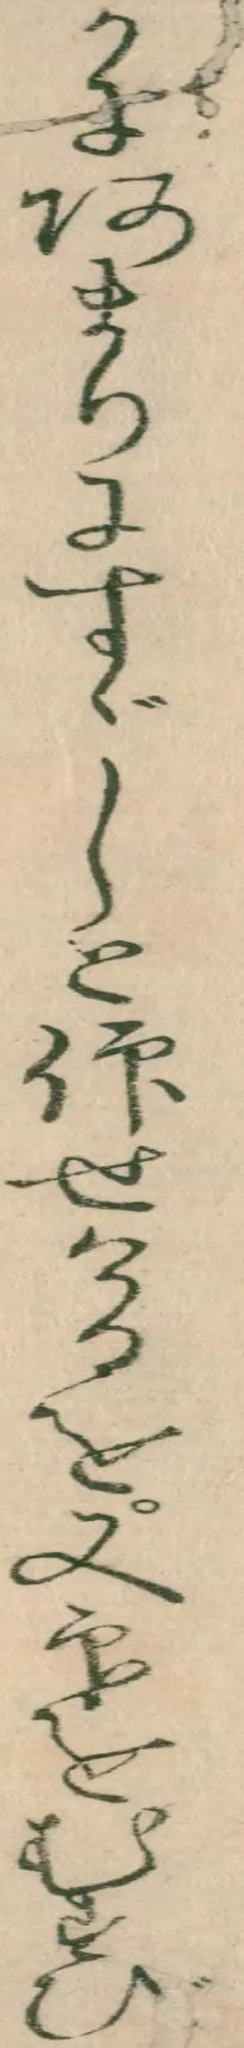かにあまりにすゞしと仰せけるを。又印をむすび
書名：弘法大師御本地 3巻. [2]
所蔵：国立国会図書館 National Diet Library, JAPAN
